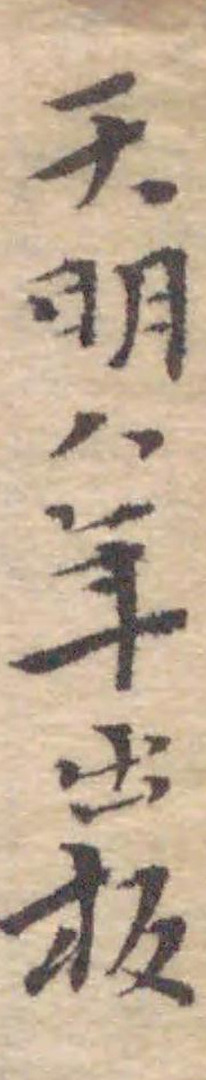天明八年出板

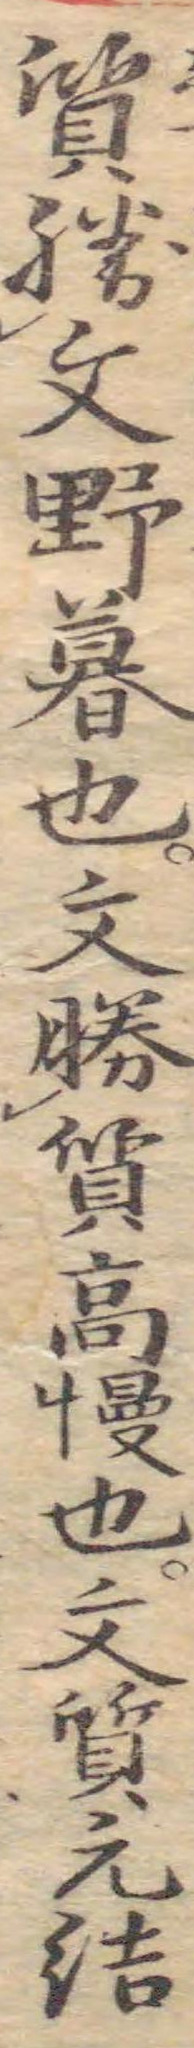質勝文野暮也。文勝質に高慢也。文質元結
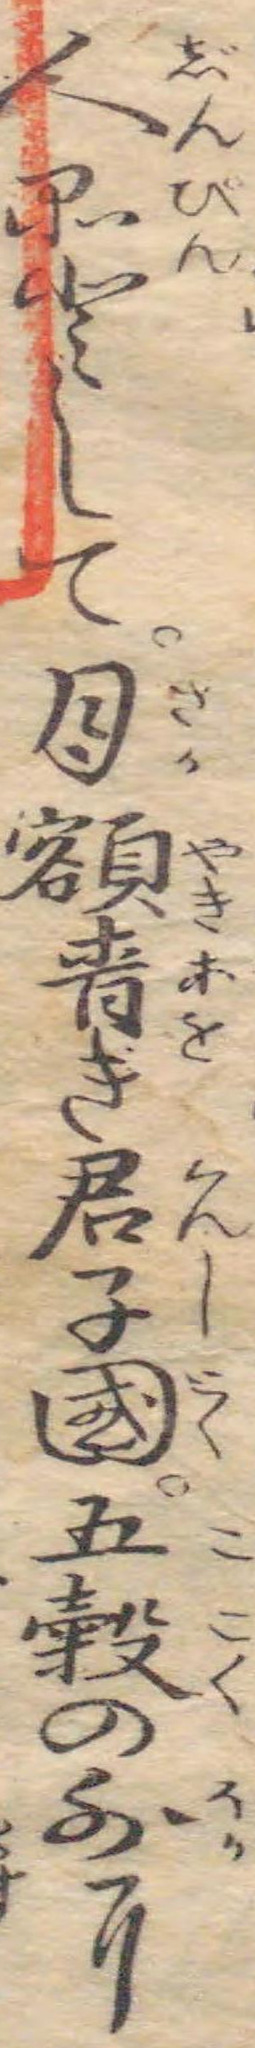人品として。月額青き君子国。五穀の外に
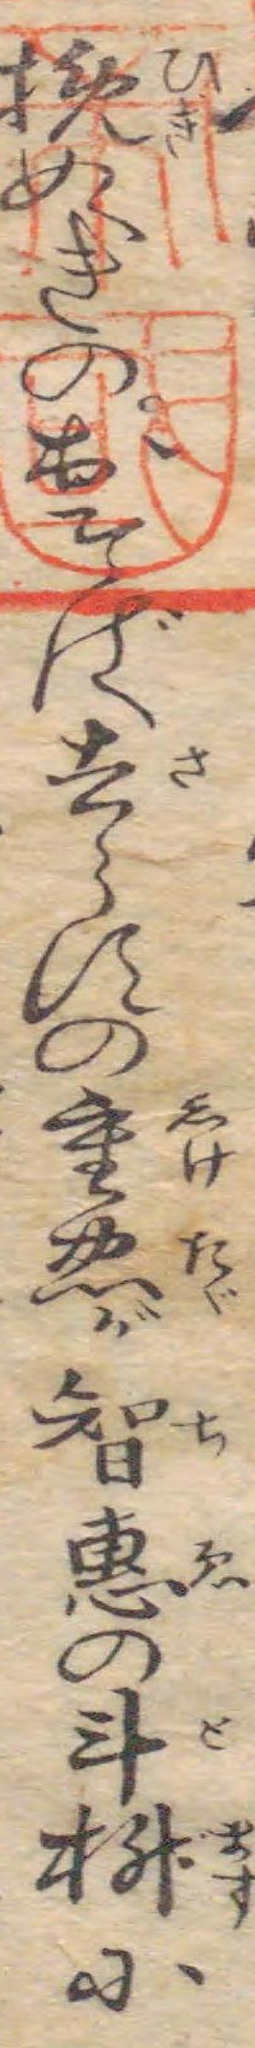挽めきの。おそば去らすの重忠が智恵の斗枡に
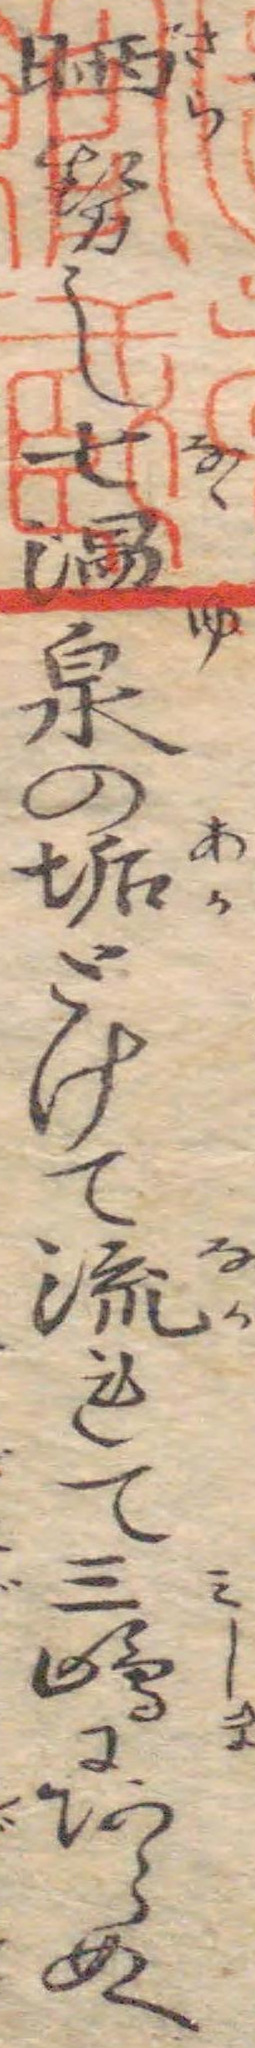晒せし七湯泉の垢とけて流れて三島にあらめへ
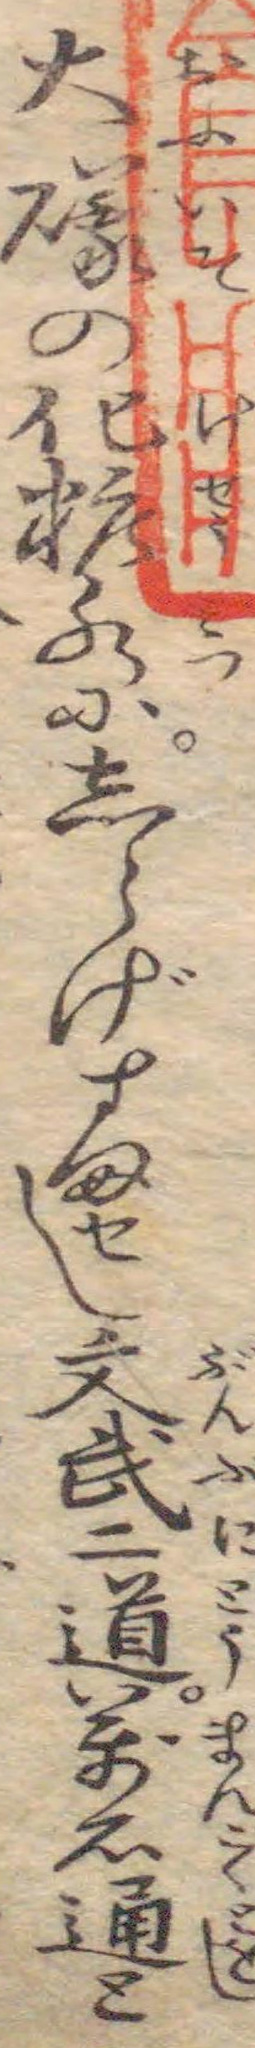大磯の化粧水に。しらげすませし文武二道。万石通と
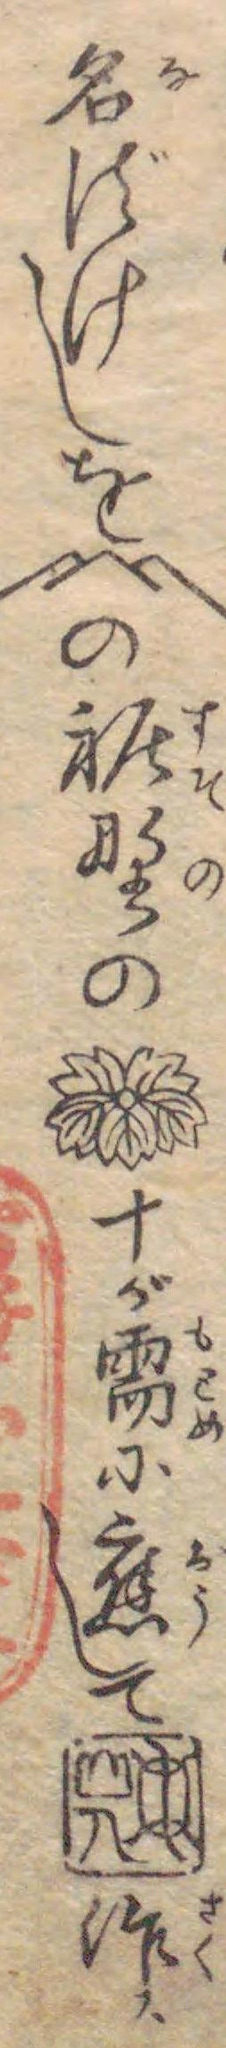名づけしをの裾野の十が需に応して作

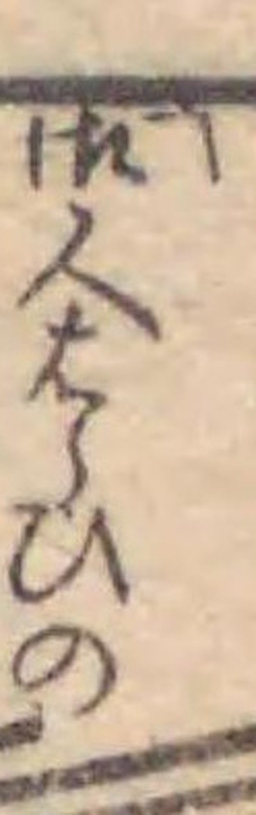御人はらひの
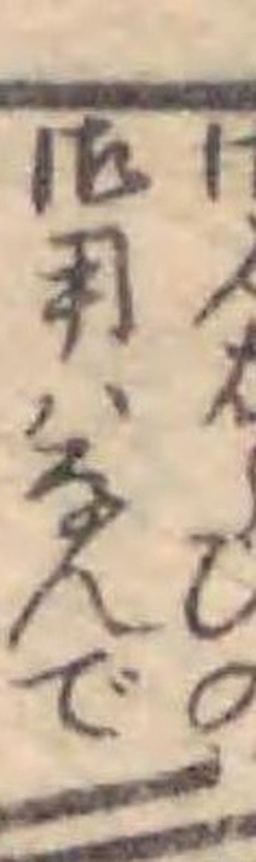御用はなんで
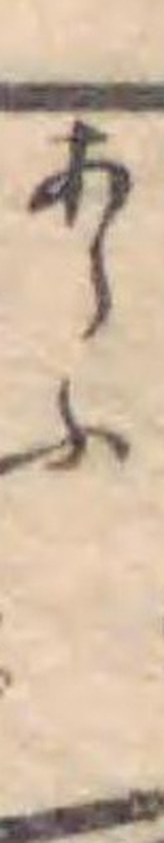あらふ
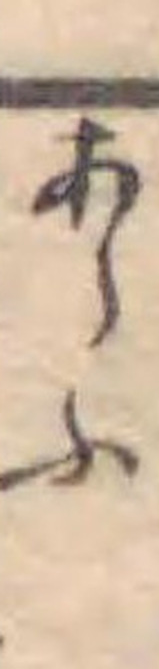あらふ
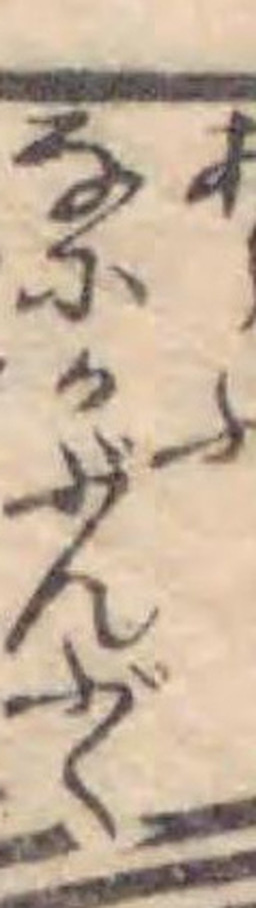なにかぶんぶく
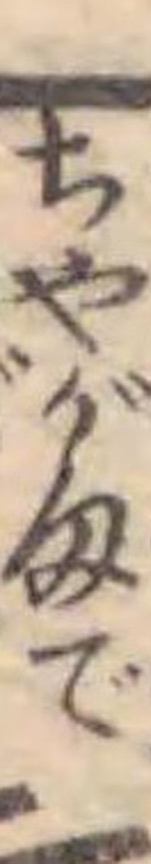ちやがまで
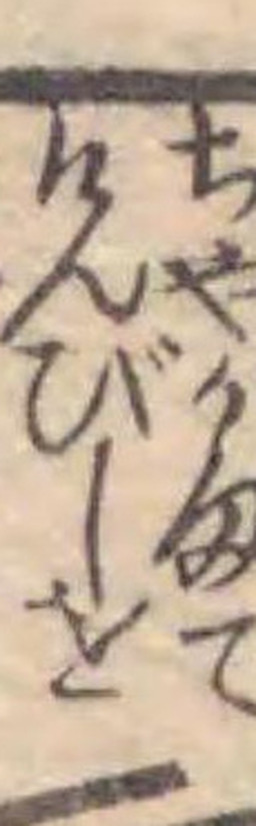けんびしを
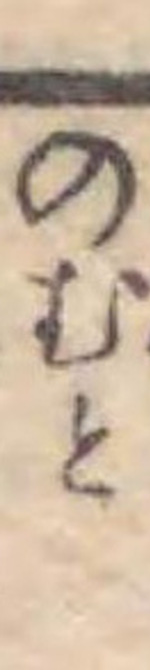のむと
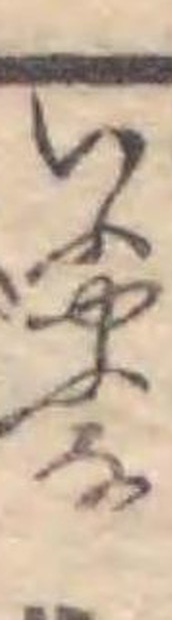いふやふな
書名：文武二道万石通 : 3巻
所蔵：国立国会図書館 National Diet Library, JAPAN
